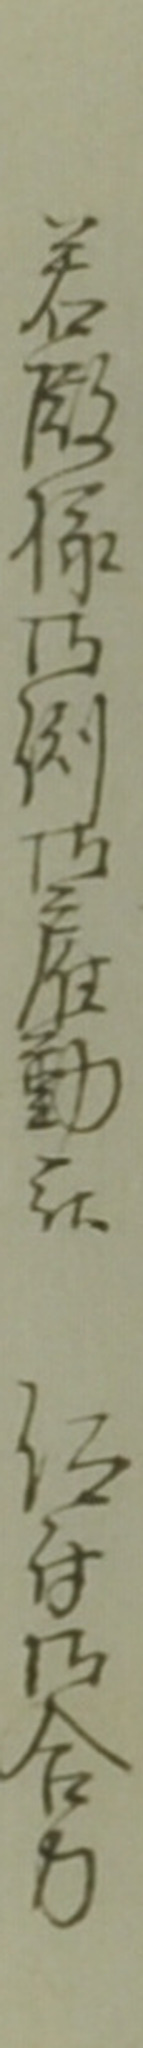若殿様御側御雇勤被仰付御合力
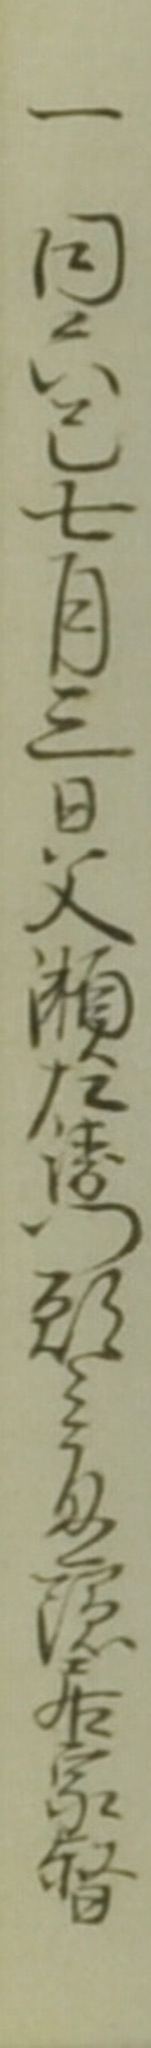一同六巳七月三日父瀬左衛門願之通隠居家督
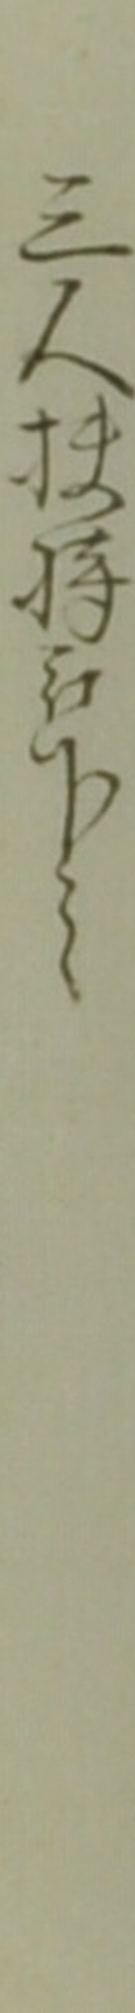三人扶持被下之
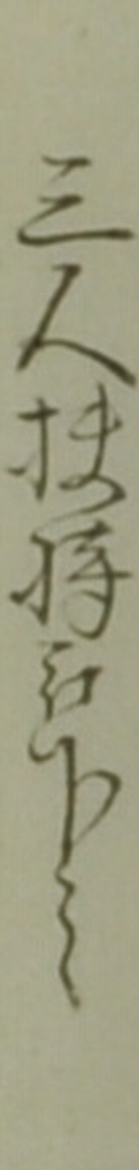三人扶持被下之

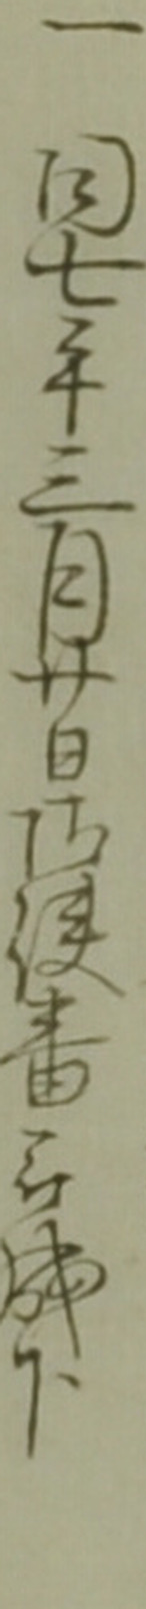一同七午三月廿日御使番被成下
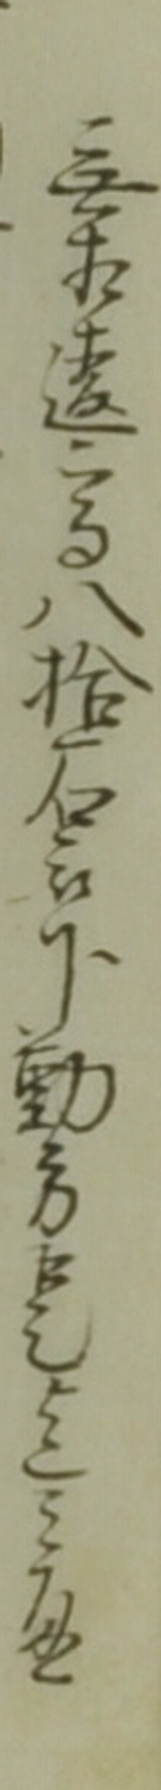無相違高八拾石被下勤方是迄之通
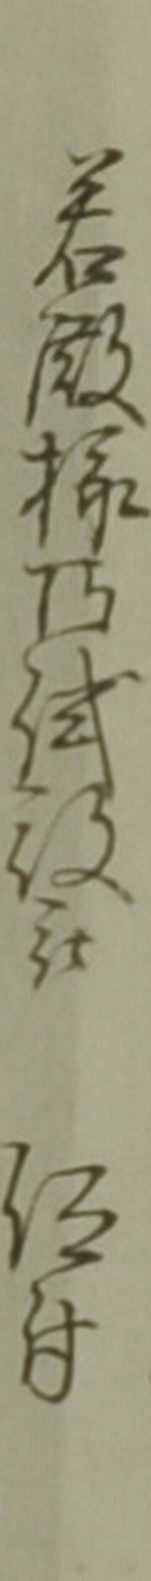若殿様御試役被仰付
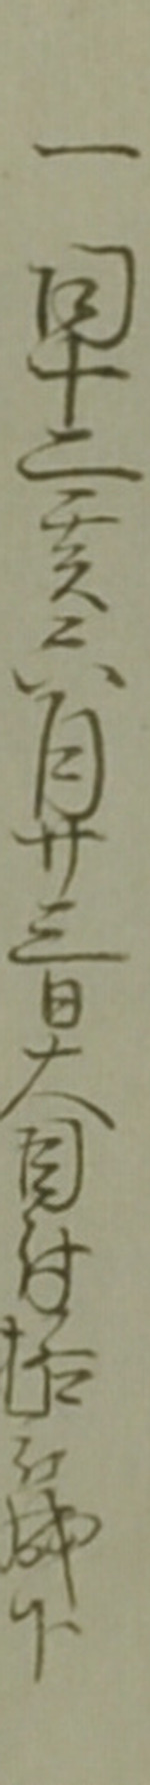一同十二亥六月廿三日大目付格被成下
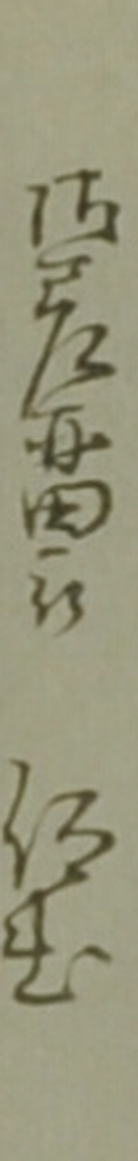御差留被仰出
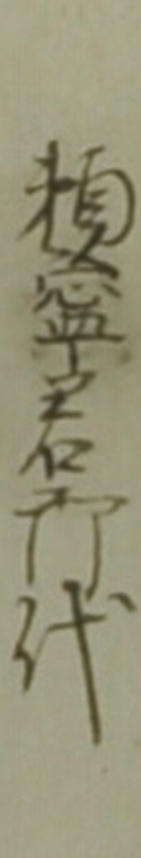頼寧君御代
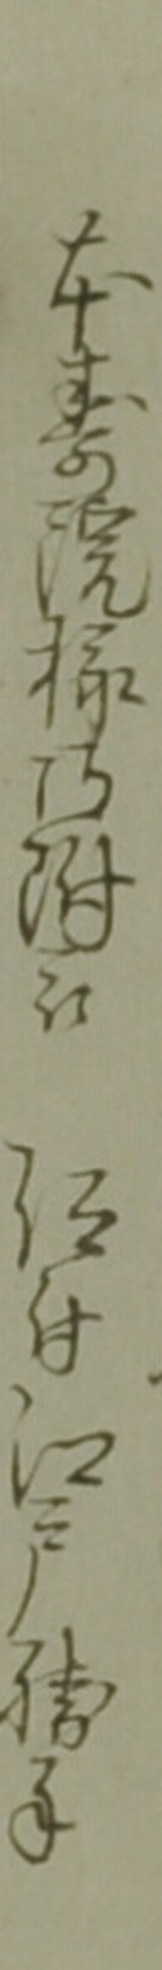本寿院様御附被仰付江戸勝手
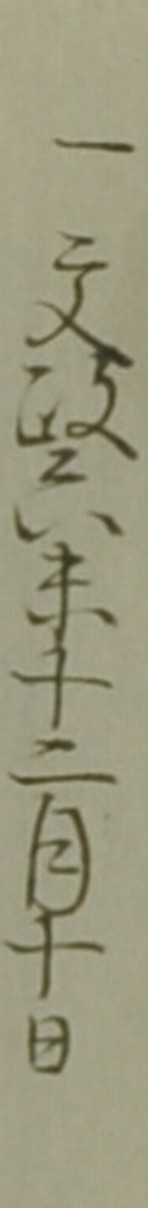一文政六未十二月十日
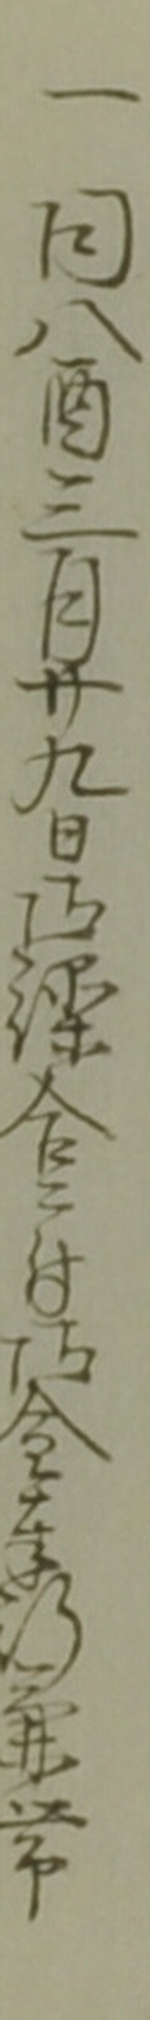一同八酉三月廿九日御繰合ニ付御金奉行兼帯
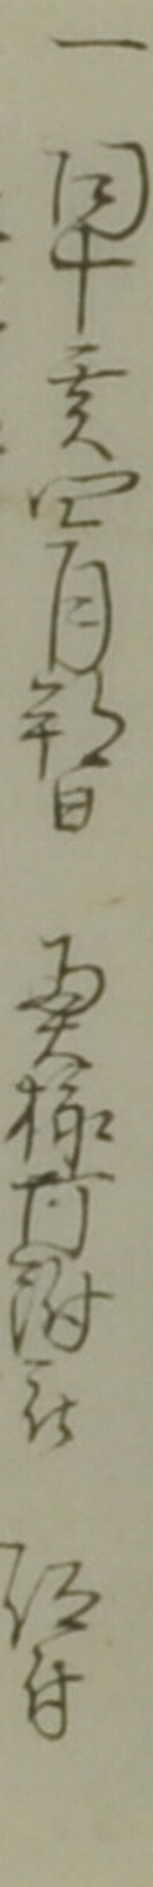一同十亥四月朔日奥様御附被仰付
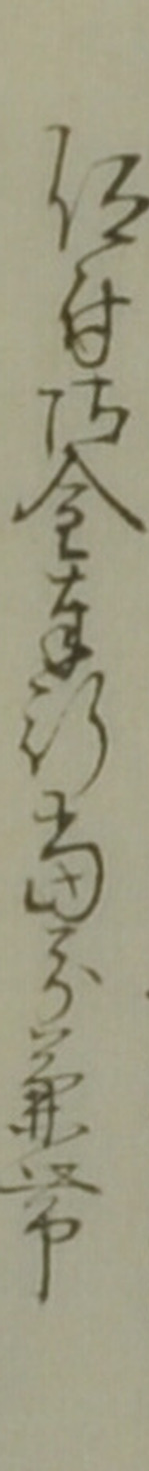仰付御金奉行当分兼帯
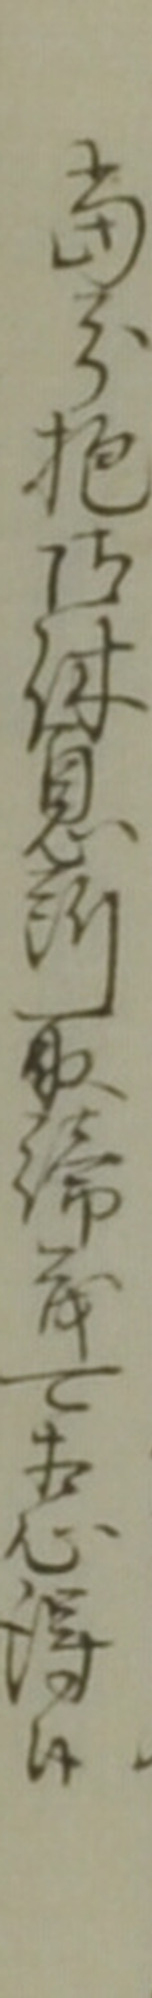当分抱御休息所取締茂可相心得候
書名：給人諸士勤仕録（三）
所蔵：伊那市立高遠町図書館・合同会社AMANE
